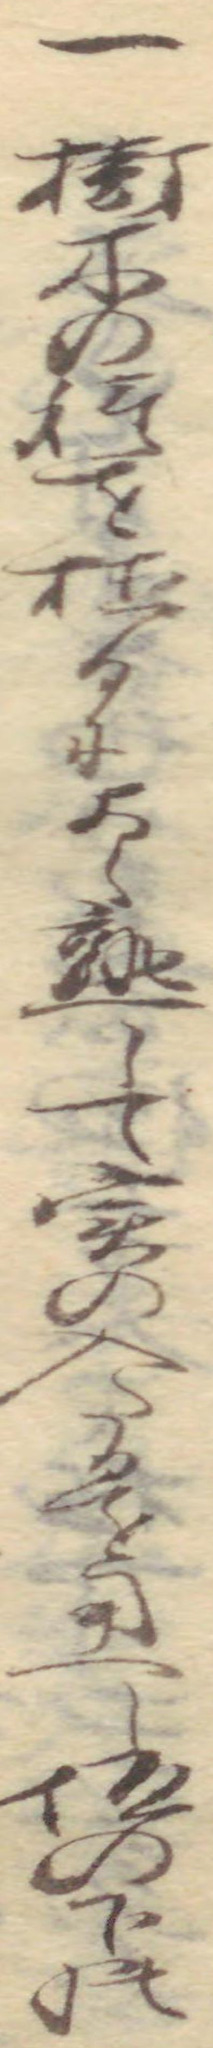一樹木の種を植るによく熟して実の入たるを用へし垣の下の
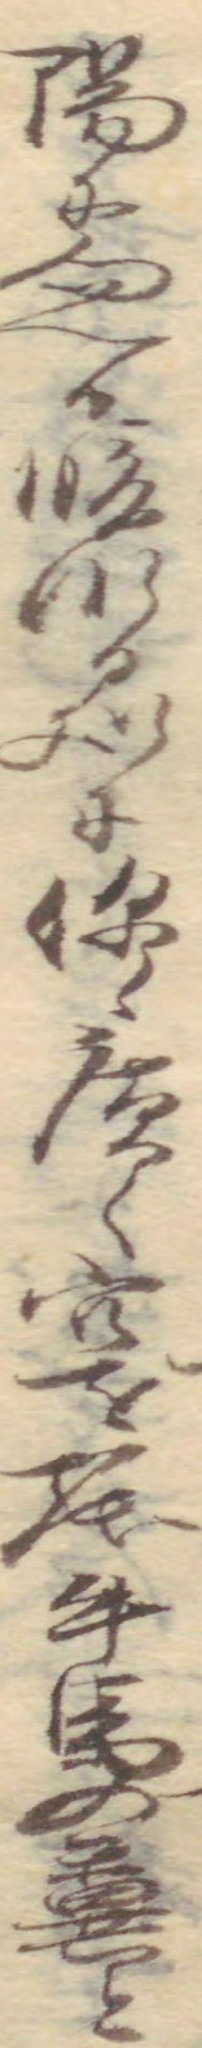陽に向へる段なる処に深く広く穴を堀牛馬の糞と
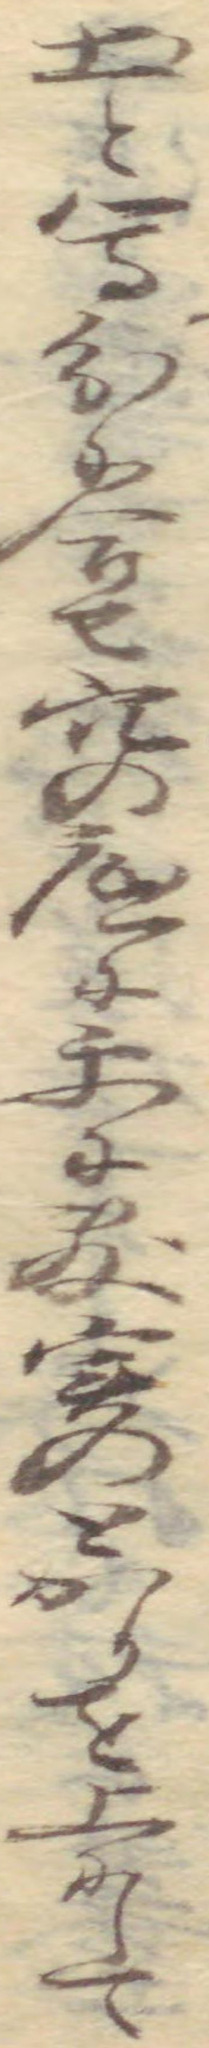土と等分に合せ穴の底に平に敷実のとかりを上にして
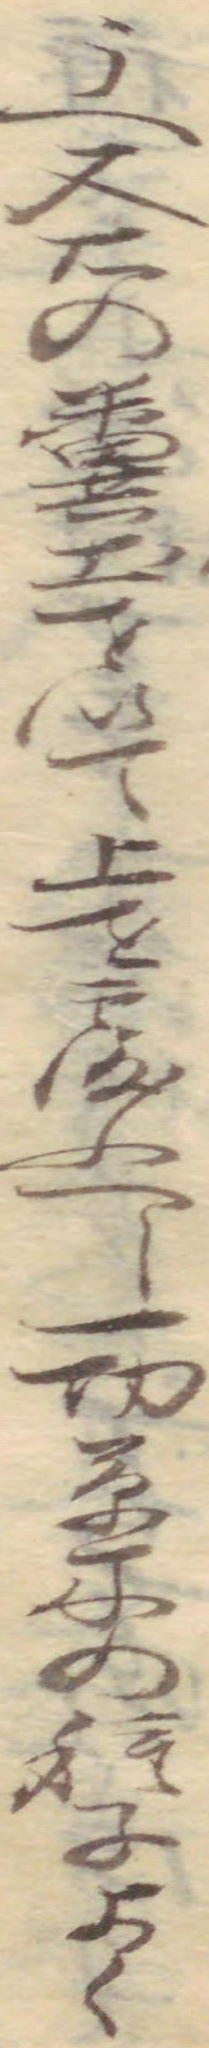うへ又右の糞土を以て上を覆ふへし一切草木の種子よく
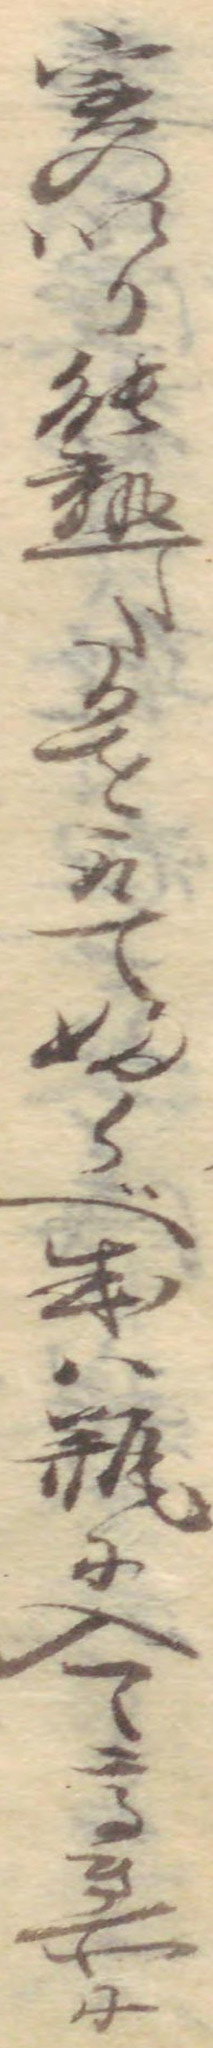実のいり能熟したるを取てふくべ或ハ瓶に入て高き所に
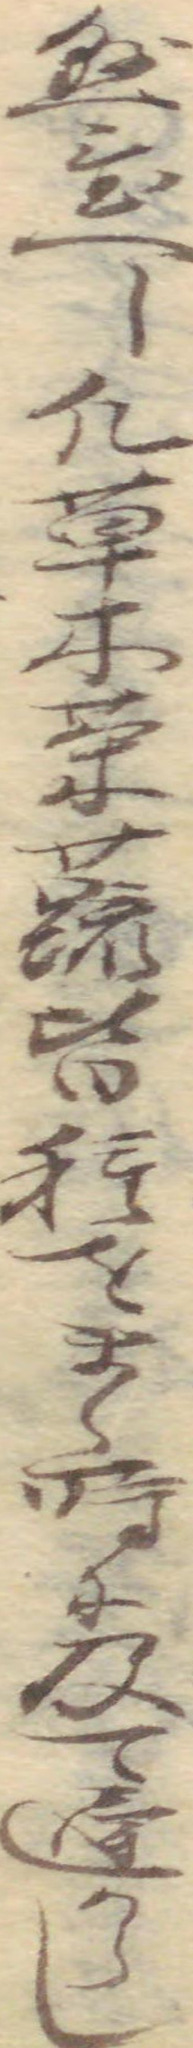懸置へし凡草木菜蔬皆種をまく時に及て遅からし
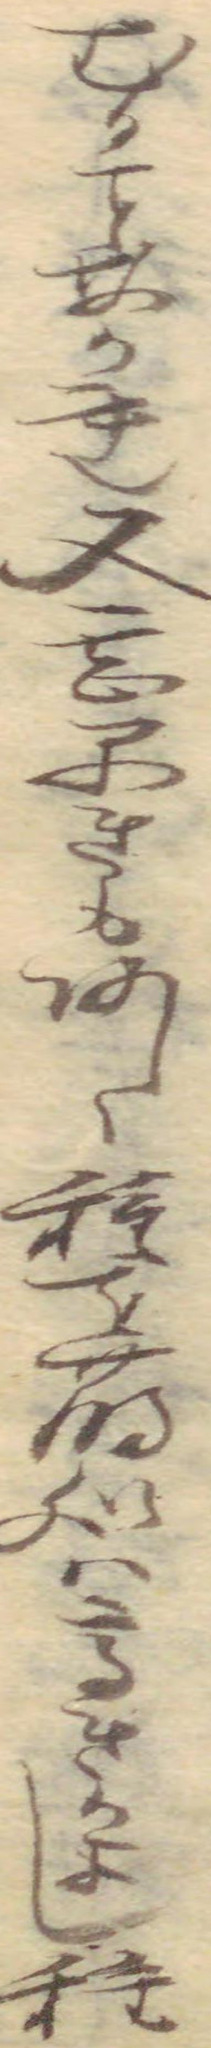むることなかれ又甚早きもあし也種を蒔処ハ高きかよし種
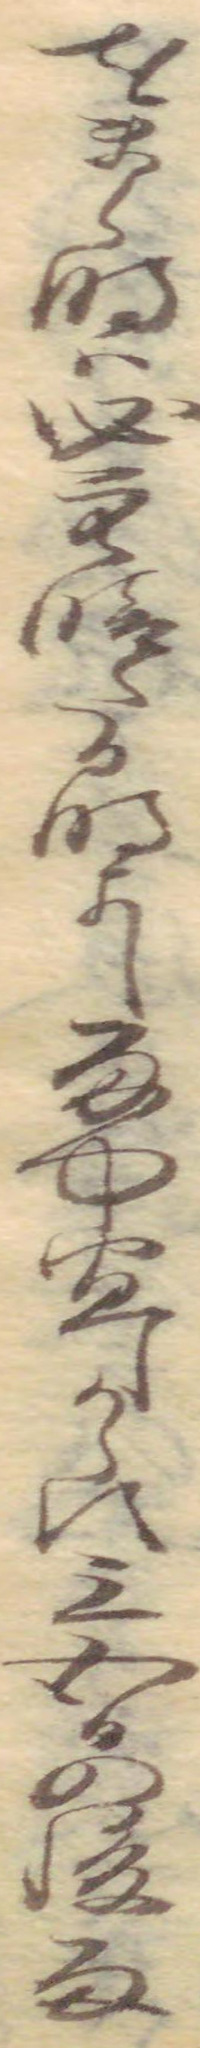をまく時ハ必空晴たる時よし雨中宜しからす三五日の後雨

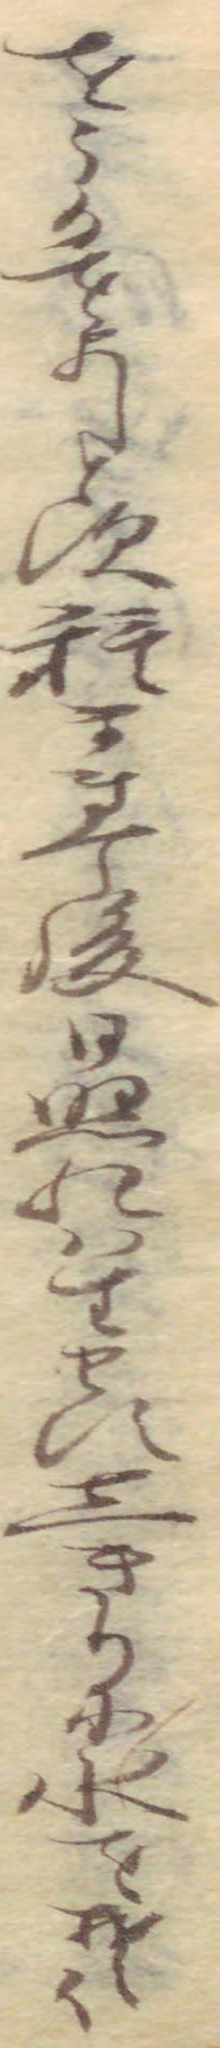をうるをよしとす種まきて後日照れハ生せすしきりに水をそゝく
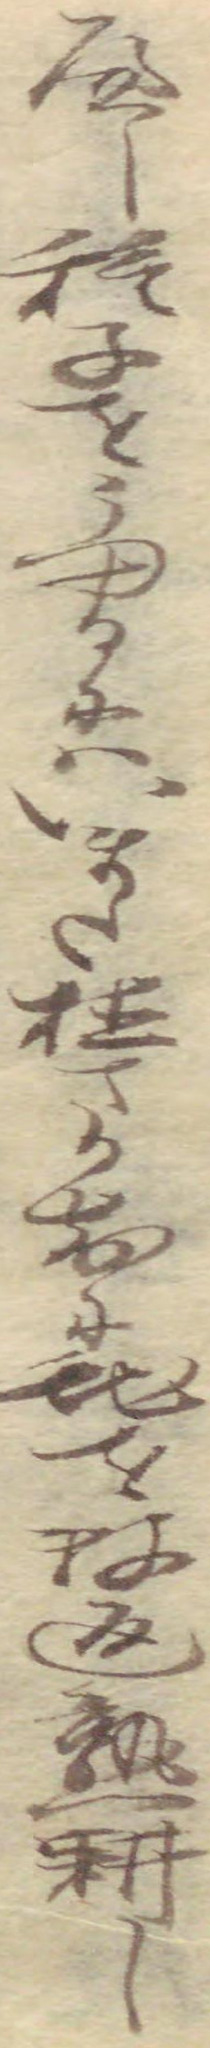へし種子をうゆるハいまた植さる前に地を堀返熟耕し
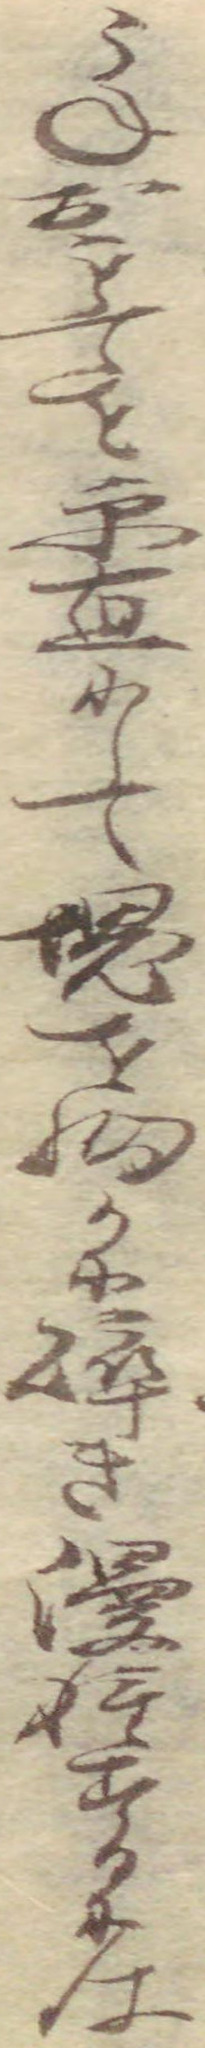うねおもてを平直にして塊を細かに砕き慢種するには
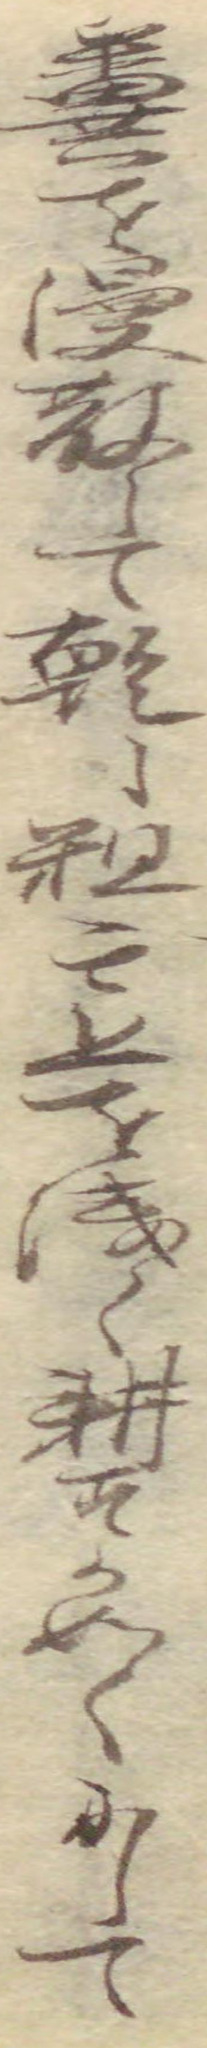糞を慢散して乾し粗其上を浅く耕すか如くにして
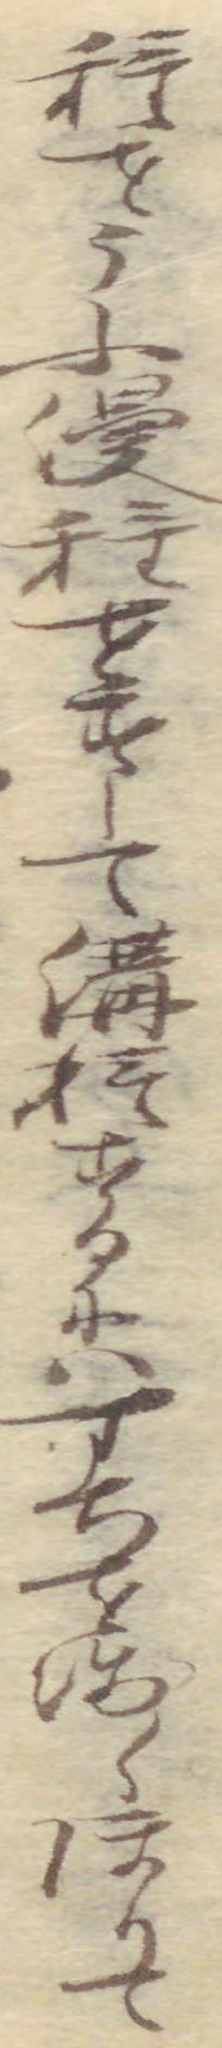種をうふ漫種せすして溝種するにハすちを浅くほりて
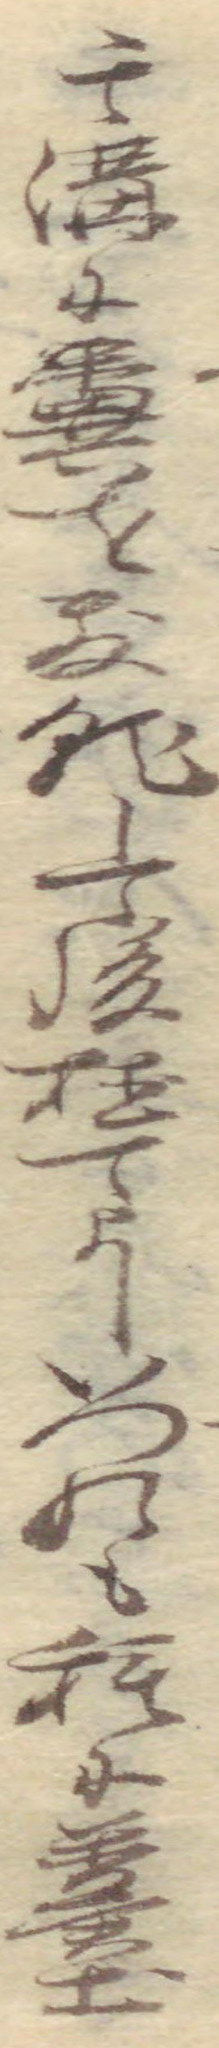其溝に糞を敷然して後植てよしいつれも種に糞土
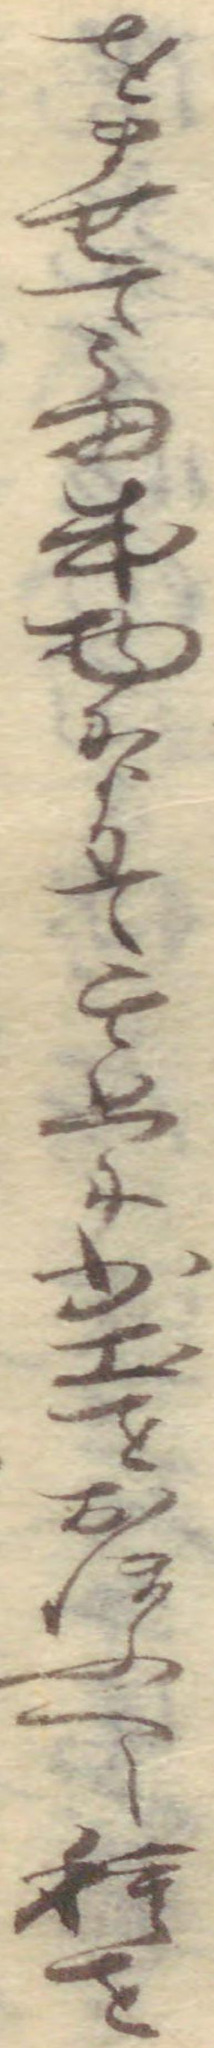をませてうゆ或物によりて其上に少土をおほふへし種を
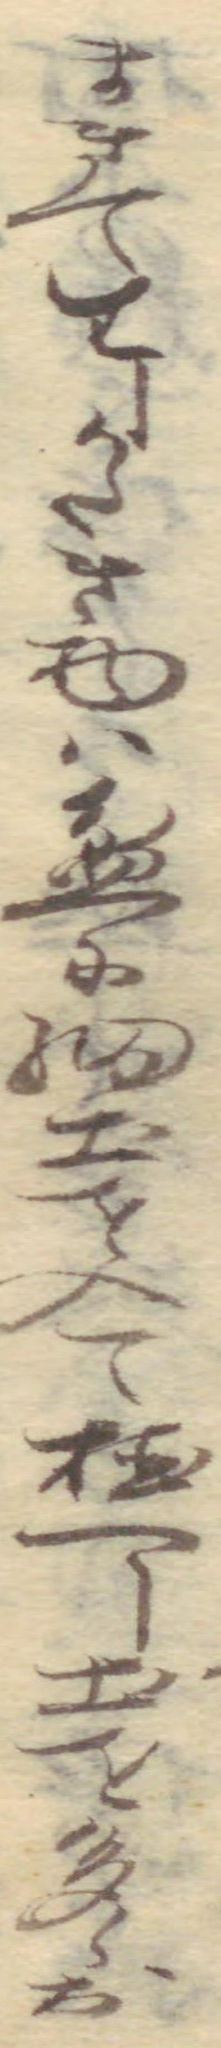まきて生しかたき物は盆に細土を入て植へし土を多くお
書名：鶯宿雑記. 巻199-200
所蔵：国立国会図書館 National Diet Library, JAPAN
